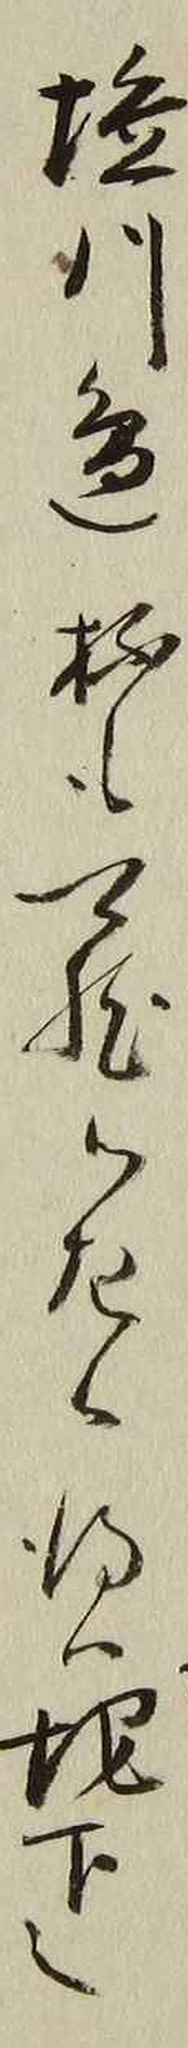塩川抔も可然候左候得は城下之
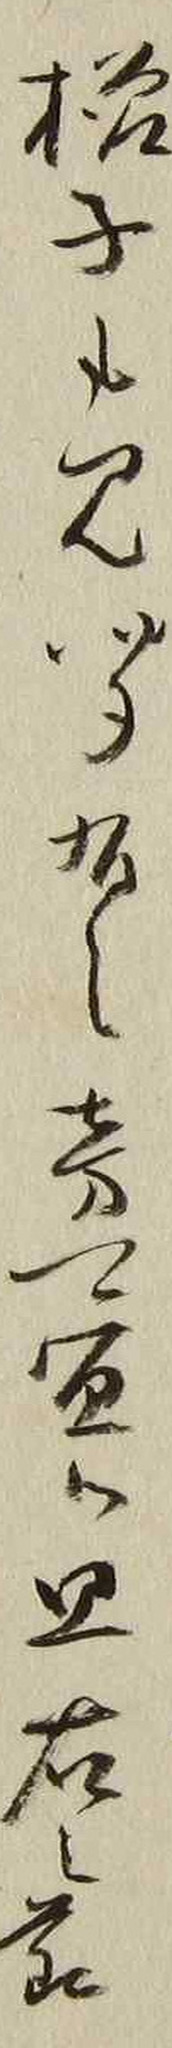様子も見聞有之旁可宜候且右之節
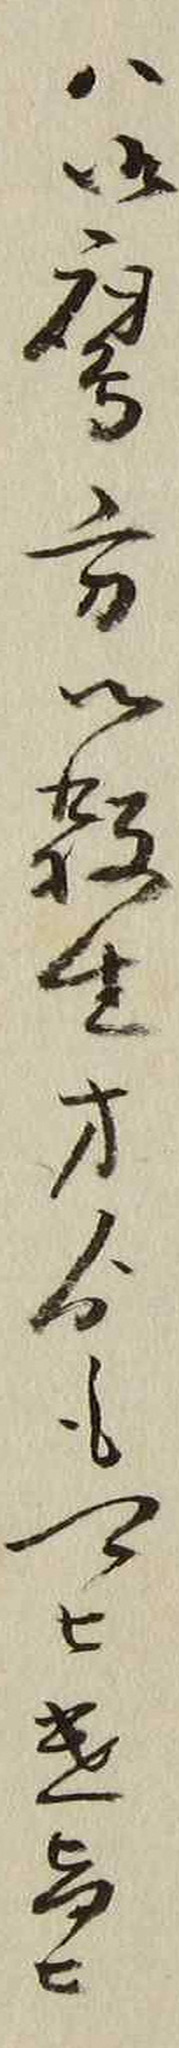は御鷹方御殺生方ゟも可被遣旨被
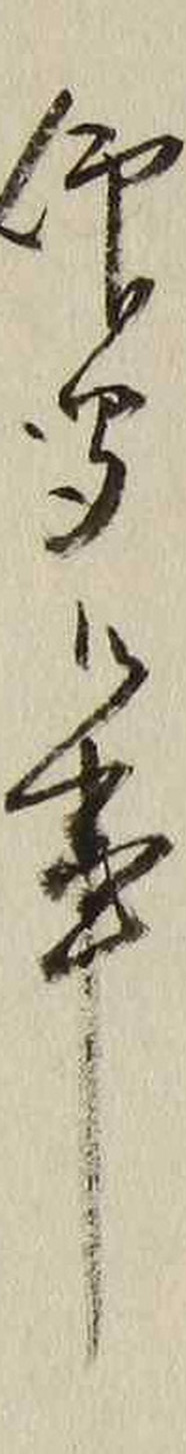仰聞候事
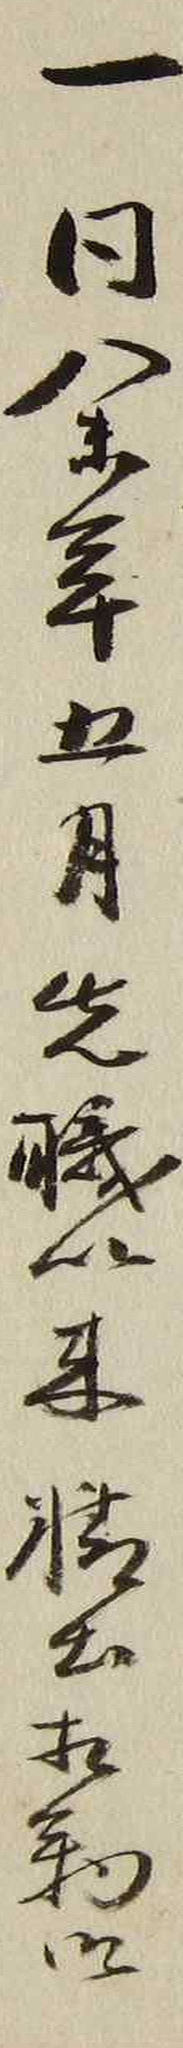一同八未年五月先職以来精出相勤御
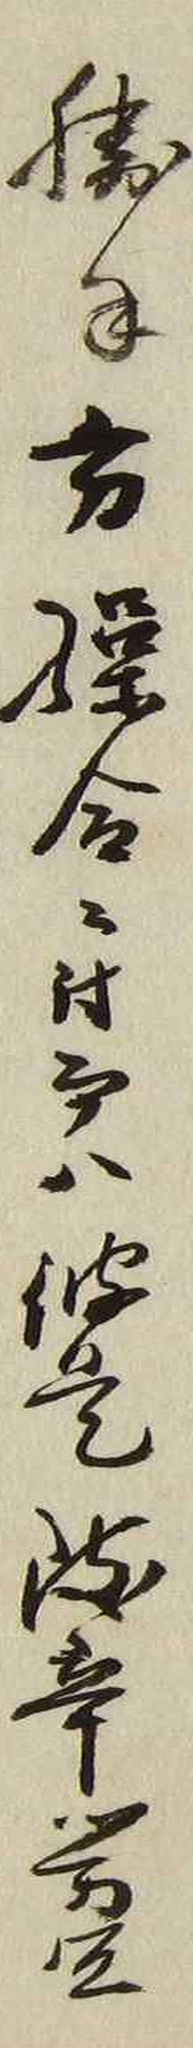勝手方繰合に付而は彼是致辛労宜
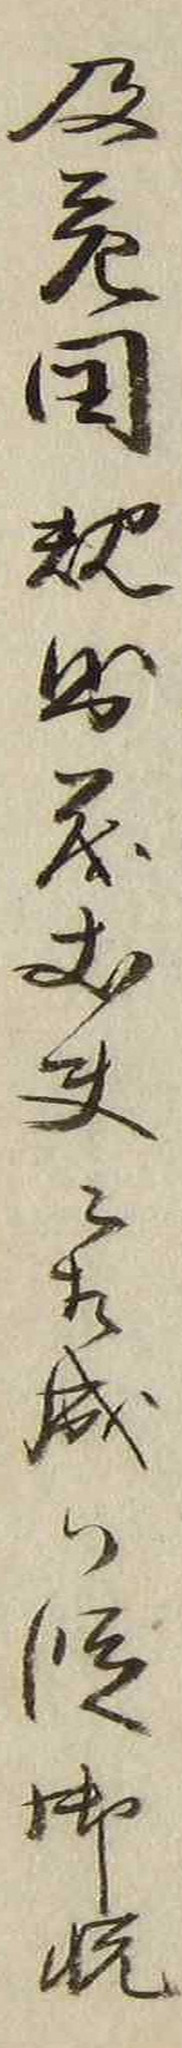及差図規則も丈夫に相成候段御悦

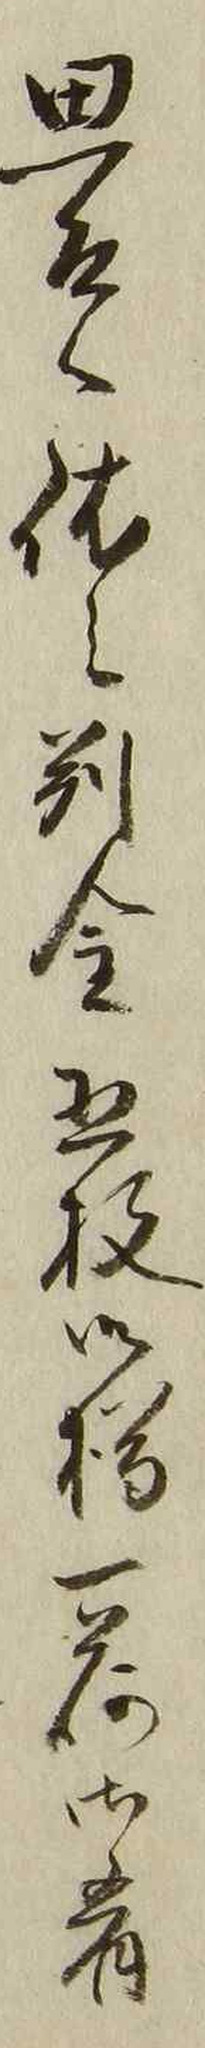思召候依之判金五枚御樽一荷御肴
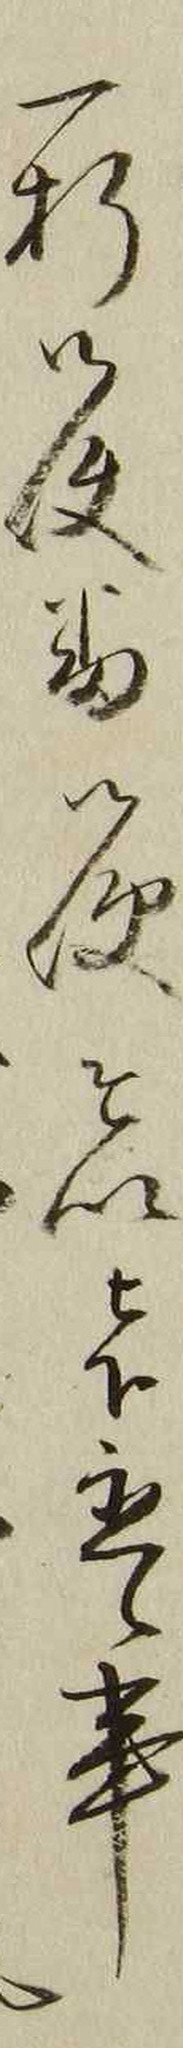一折御使番御使を以被下置候事
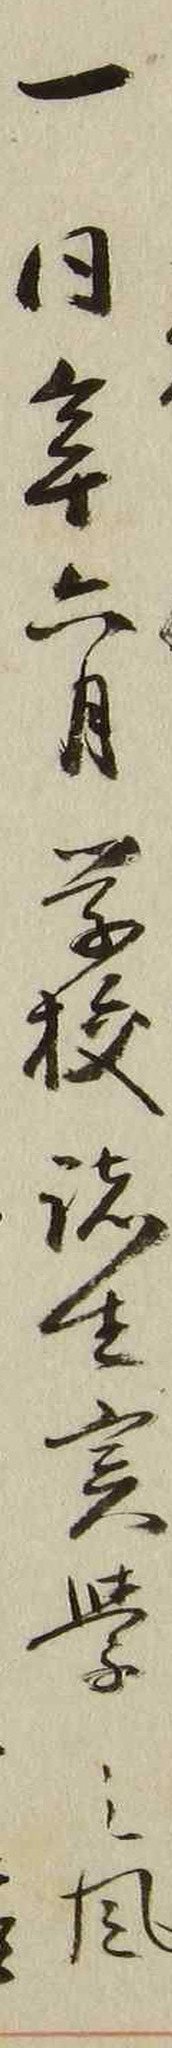一同年六月学校諸生実学之風
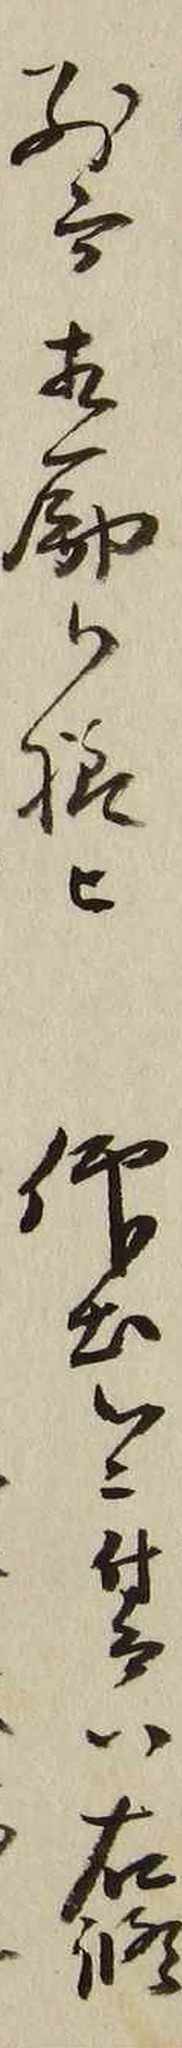別而相励候様被仰出候に付而は右修
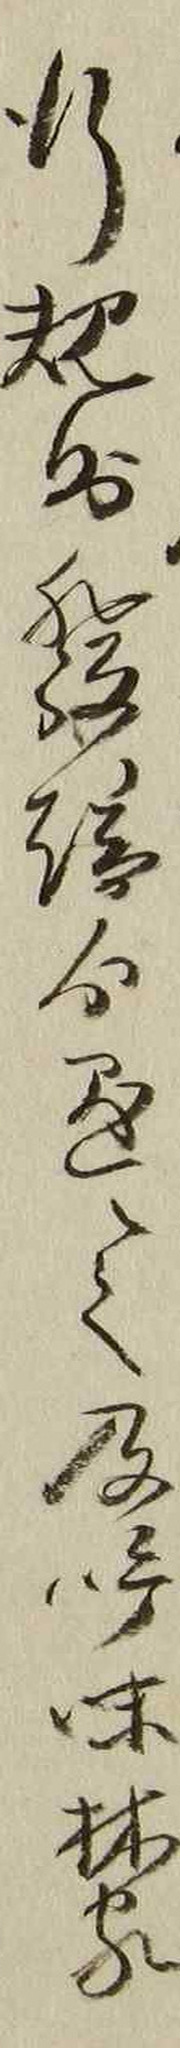行規則発端ゟ懸へ之及吟味林家
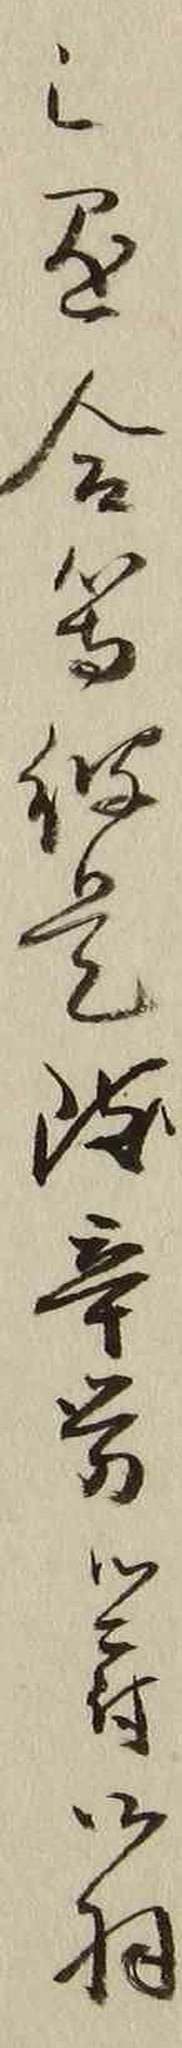之懸合等彼是致辛労候に付御羽
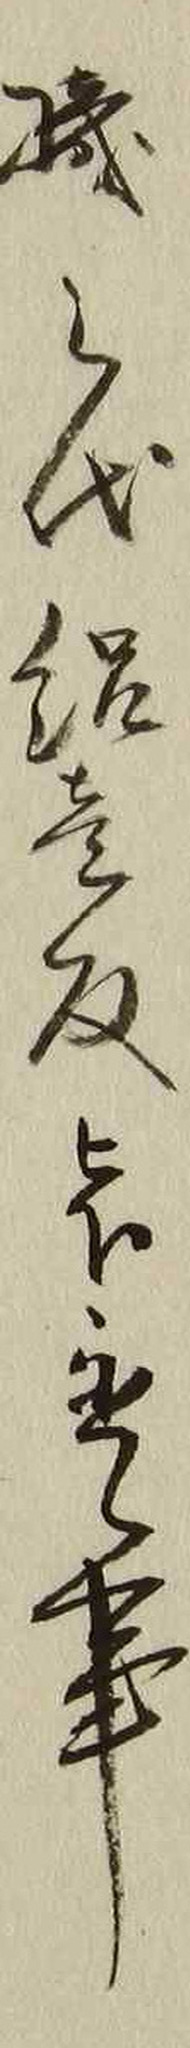織之代絹壱反被下置候事
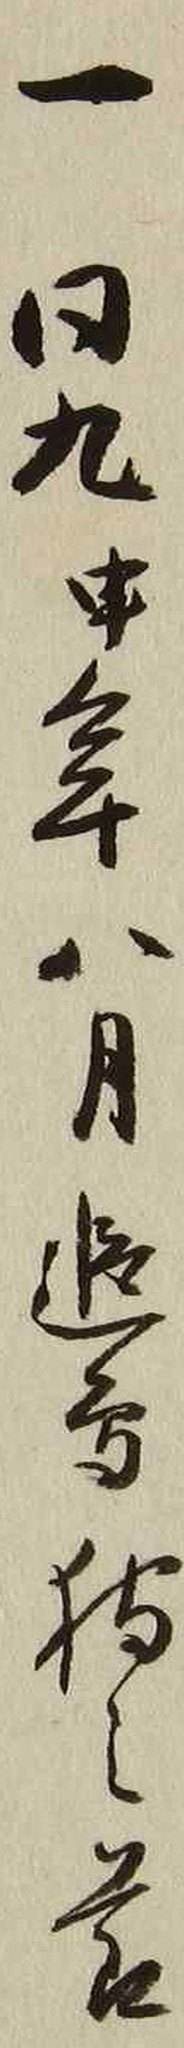一同九申年八月追鳥狩之節
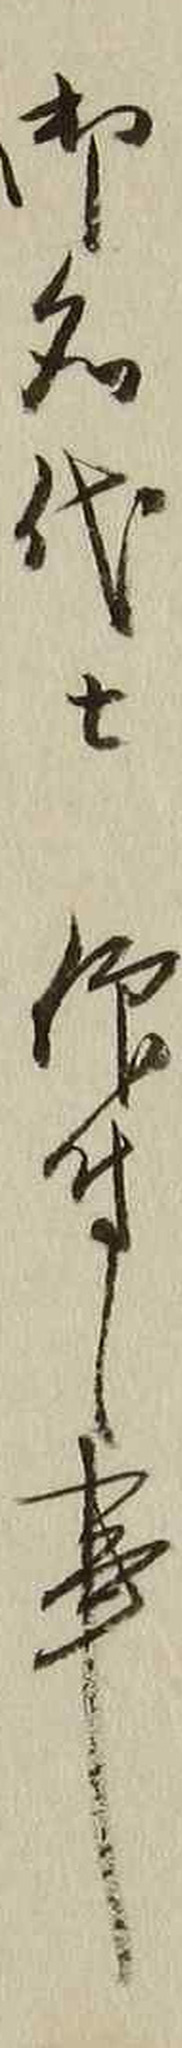御名代被仰付候事
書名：諸士系譜　巻之292　き之部1
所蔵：会津若松市立会津図書館
